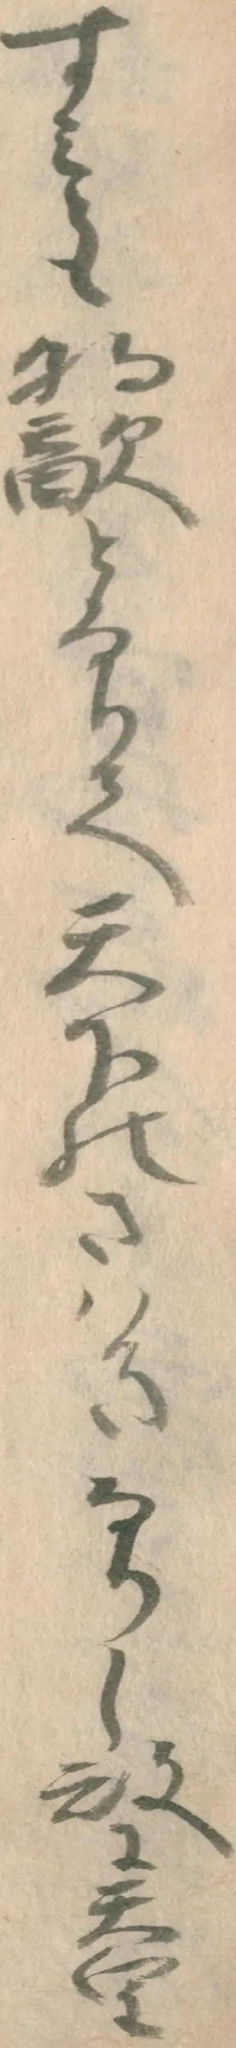すみとも朝敵となりて天下のさはきなりし故に天皇
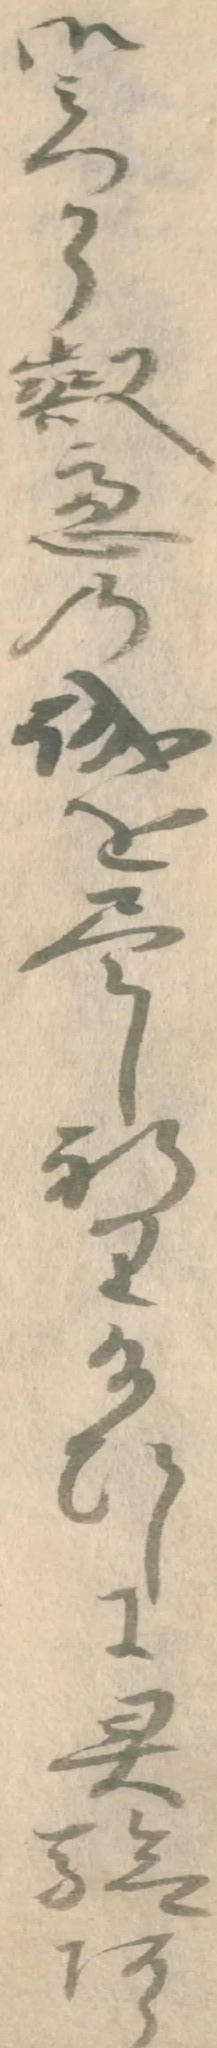御みつから叡慮の誠を尽し祈り給ひしに霊験あら
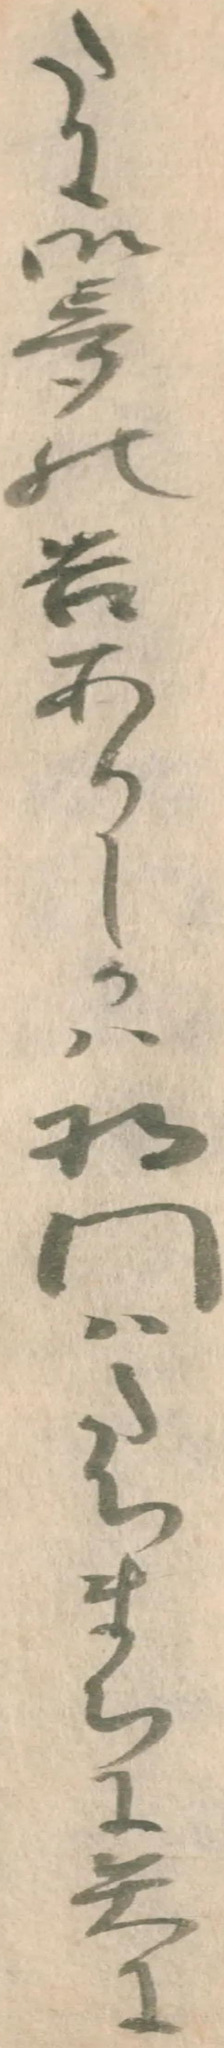たに御夢の告ありしかは将門はたちまちに矢に
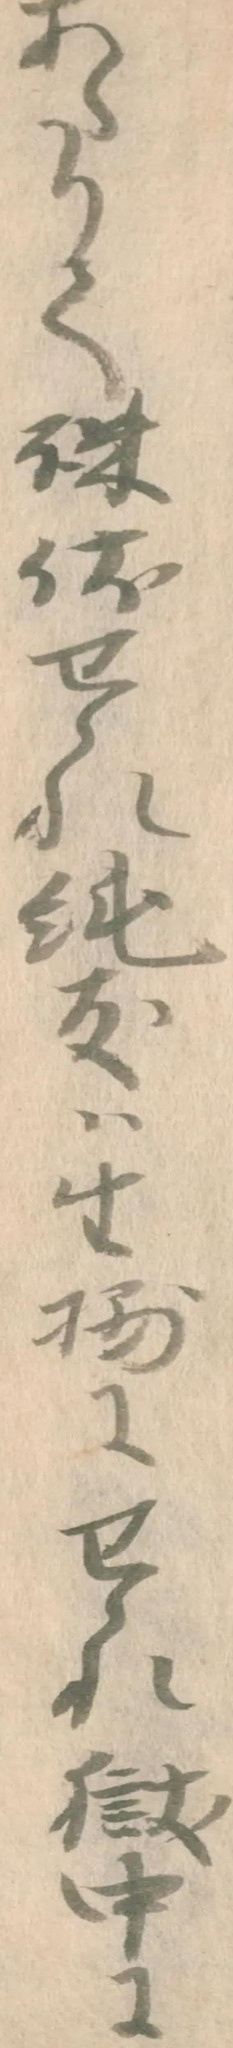あたりて誅伏せられ純友は生捕にせられ獄中に
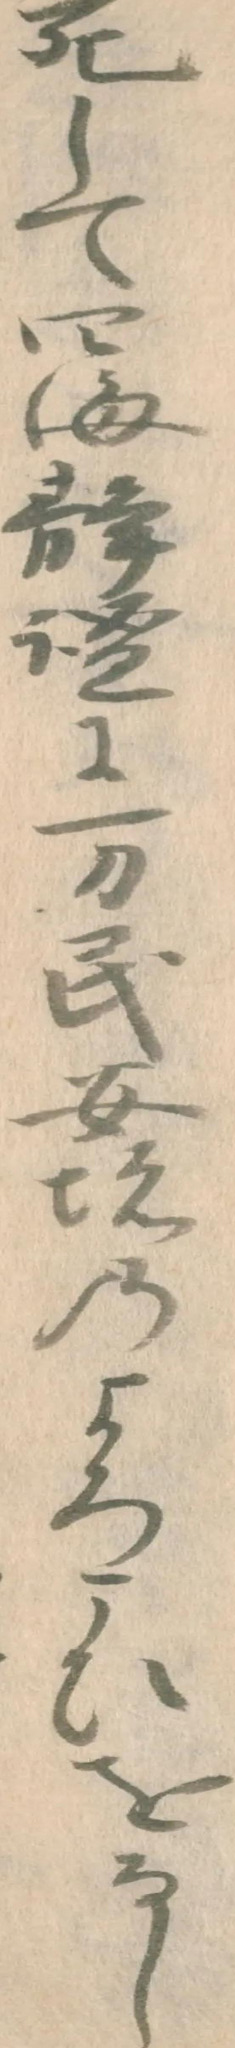死して四海静謐に万民安堵のよろこひをなし
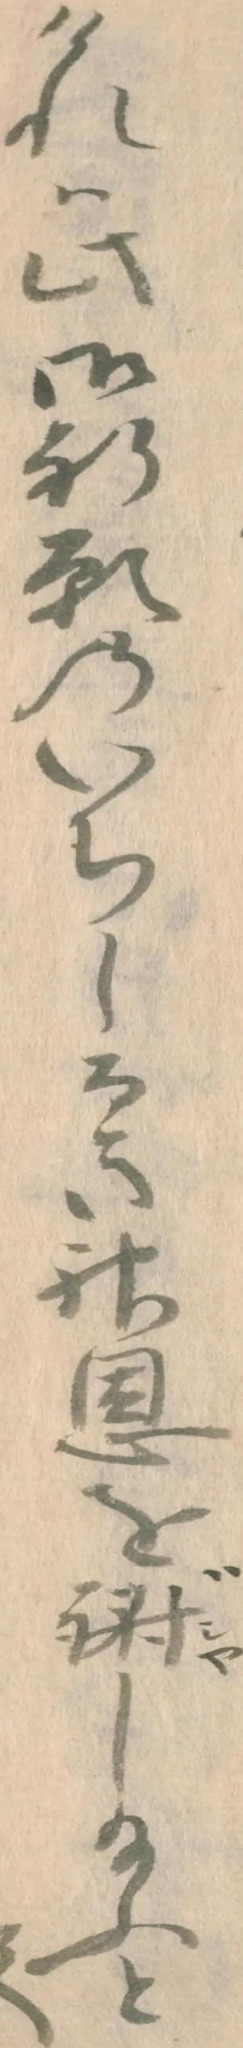けれは此御祈願のいちしるき神恩を謝し給ふとて
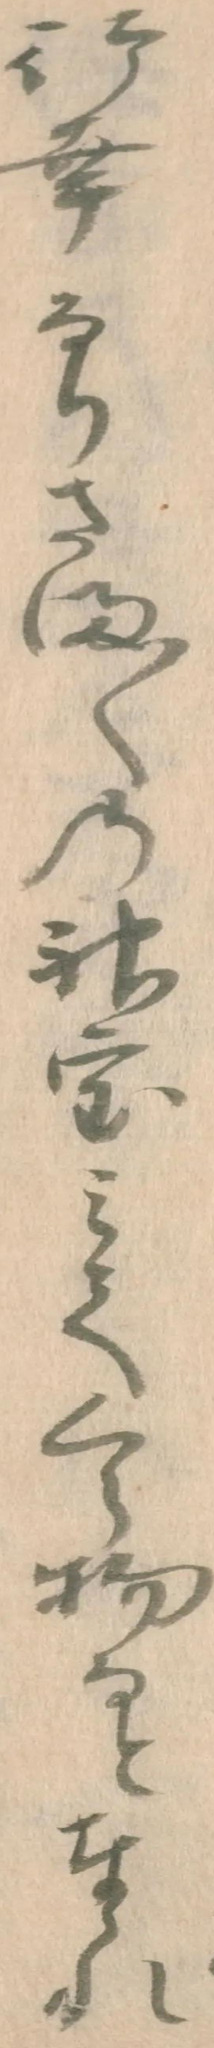行幸なりさま〳〵の神宝みてくら物なと奉られ
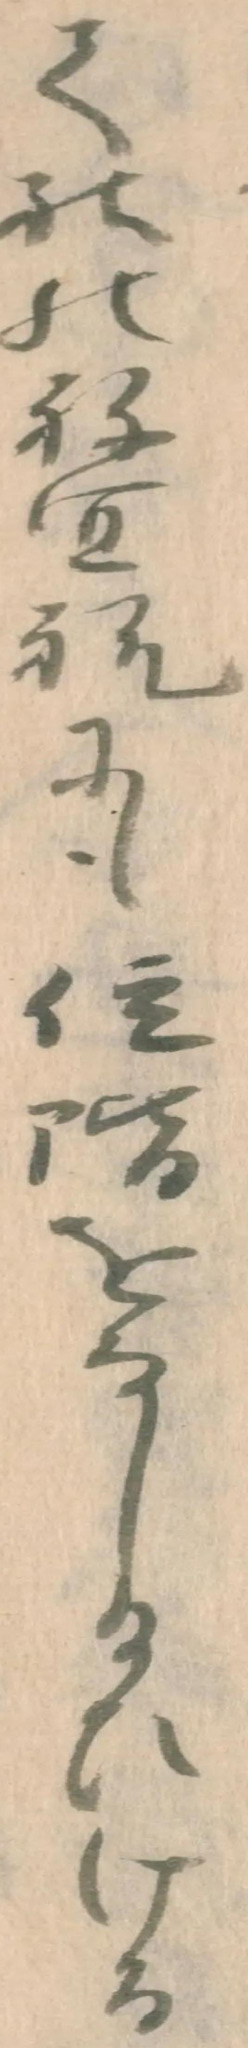て社の祢宜祝にも位階をなし給ひける
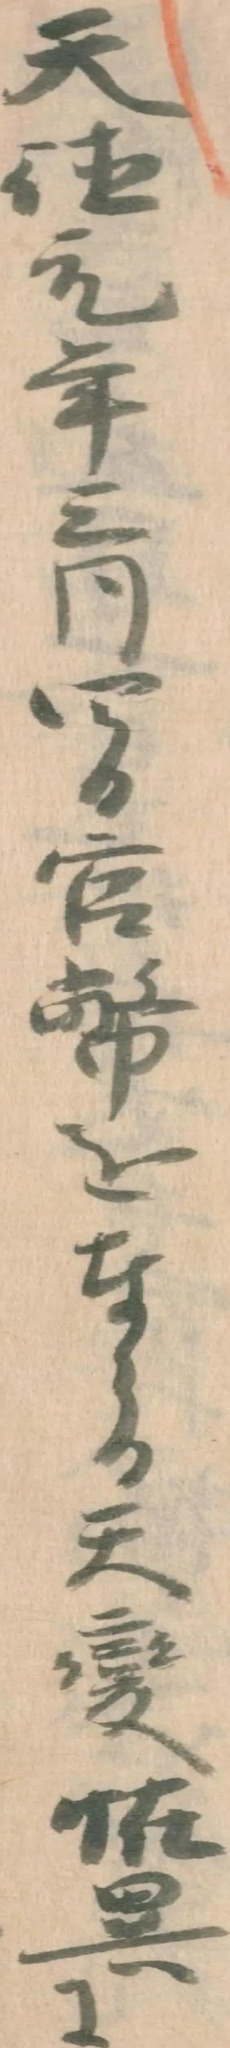天徳元年三月四日官幣を奉らる天変怪異に
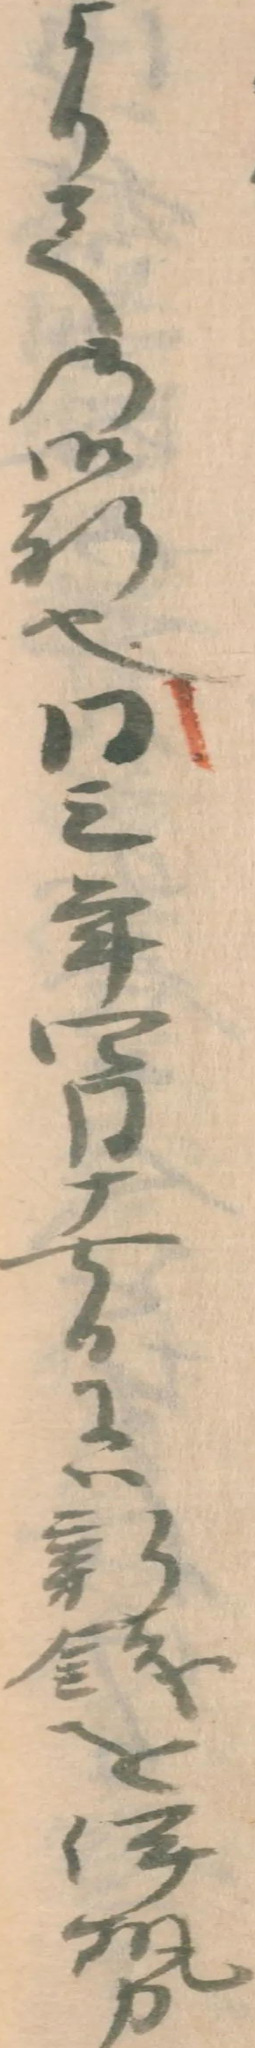よりての御祈也同三年四月十七日には新銭を伊勢
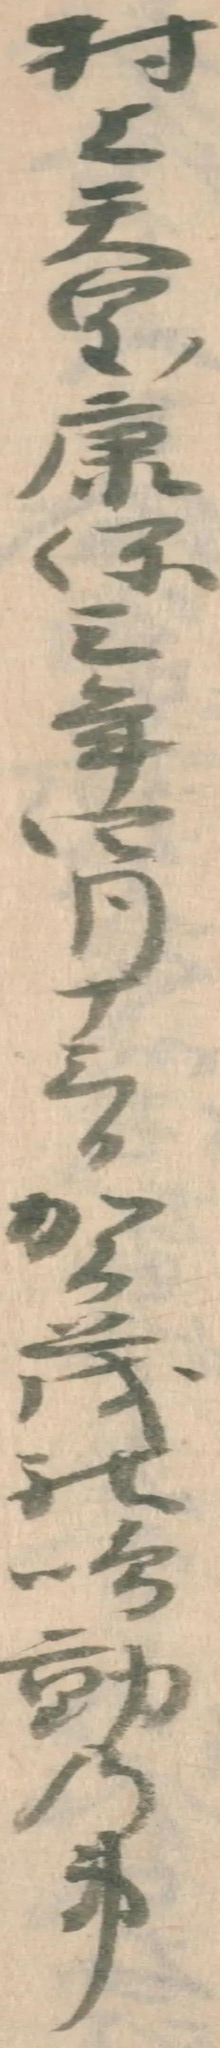村上天皇康保三年四月十三日賀茂社鳴動の事
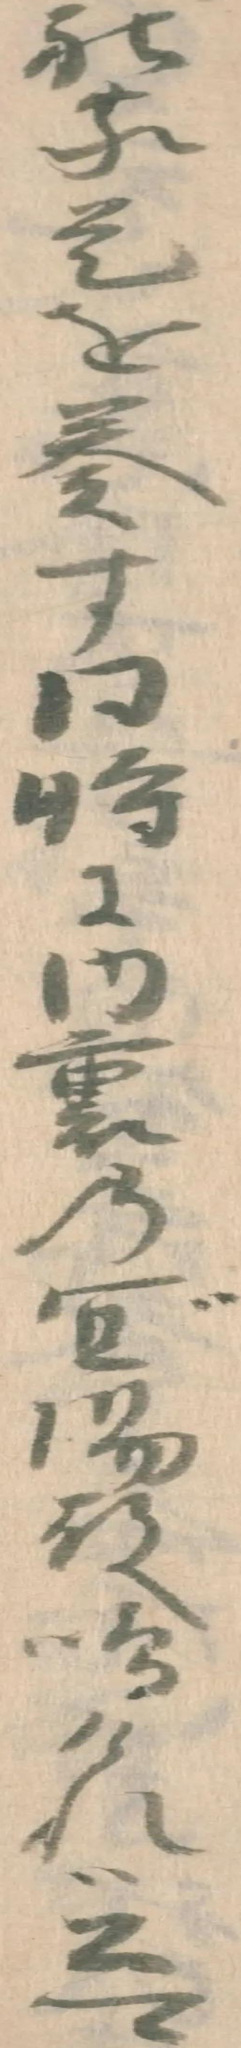社家是を奏す同時に内裏の宜陽殿鳴けれは公卿
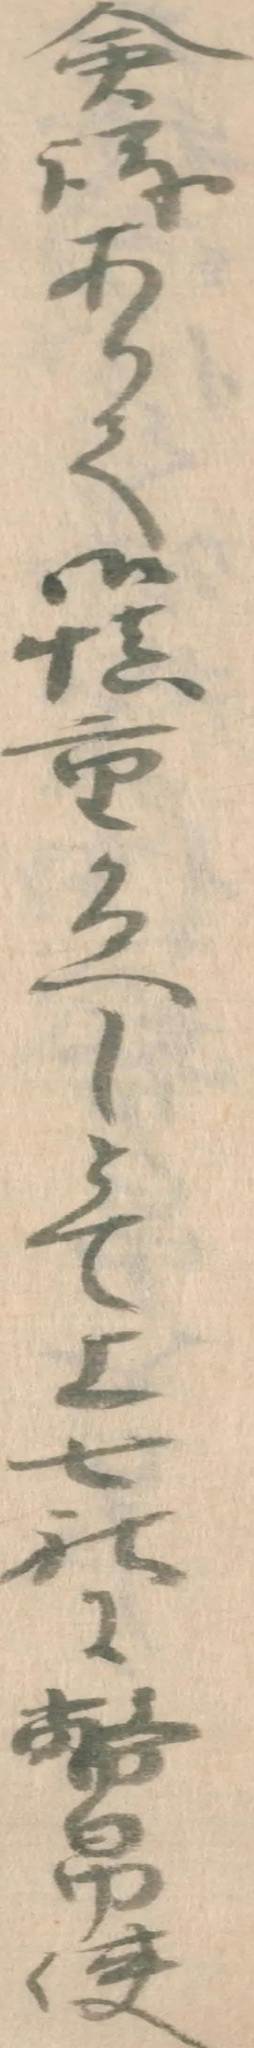僉議ありて御慎重かるへしとて上七社に幣帛使
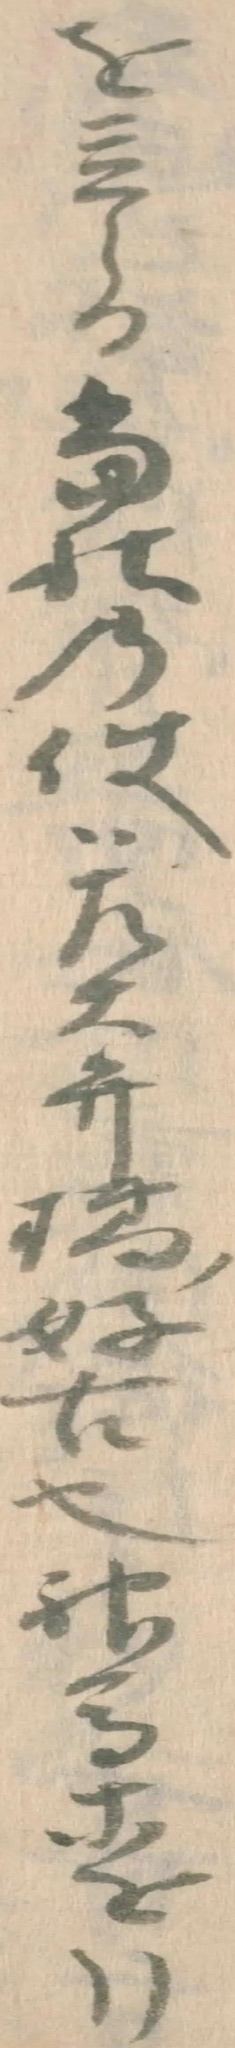を立らる当社の使は左大弁橘好古也神馬等を引
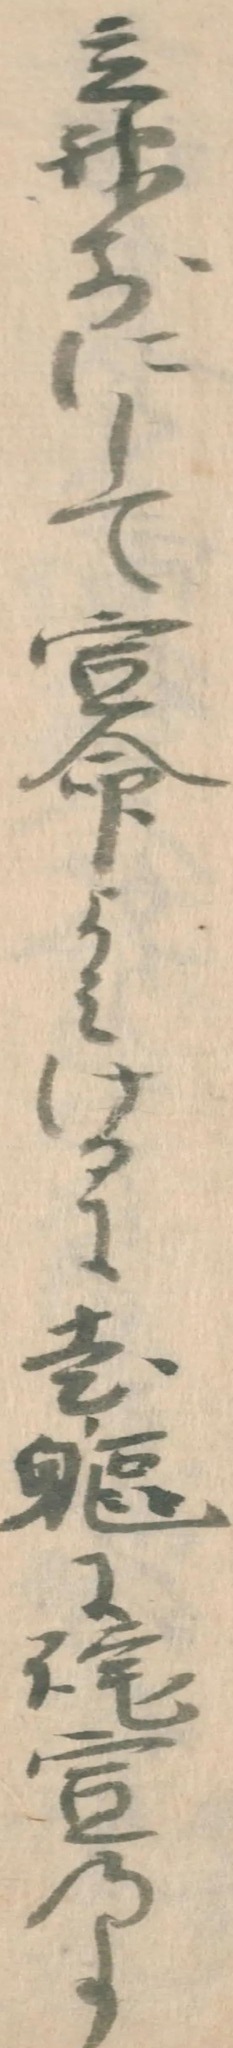立神前にして宣命よみけるに老-軀に詫宣の事
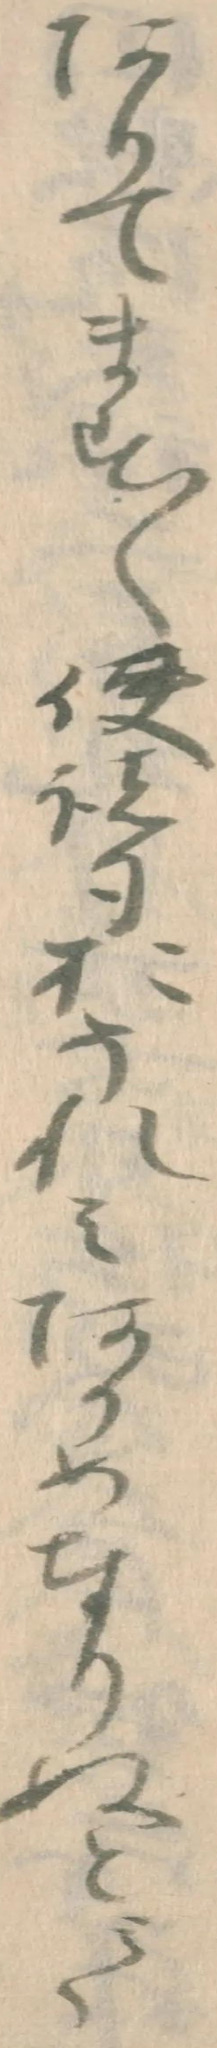ありてます〳〵使諸司おそれみあかめ奉りぬと云々
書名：賀茂社記録. 第1冊
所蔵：国立国会図書館 National Diet Library, JAPAN
